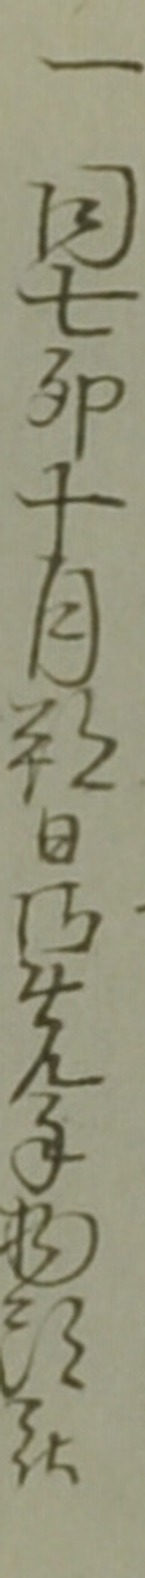一同七卯十月朔日御先手物頭被
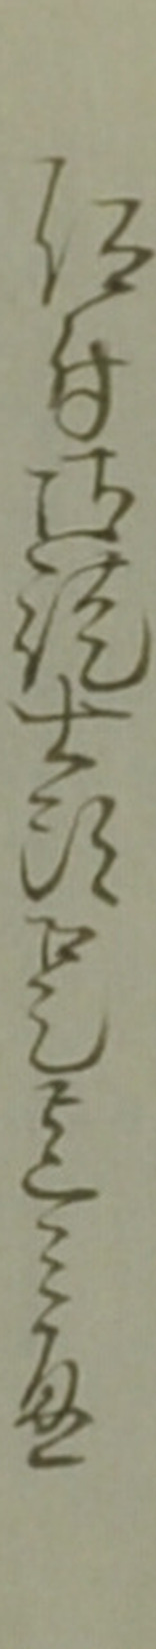仰付御徒士頭是迄之通
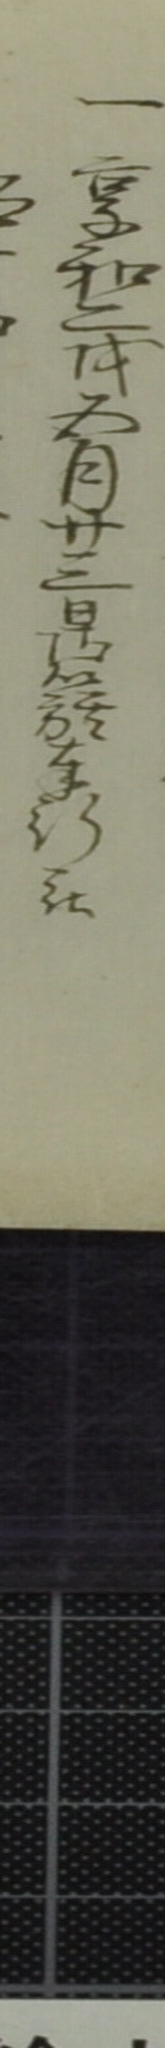一享和二戌五月廿三日御簱奉行被
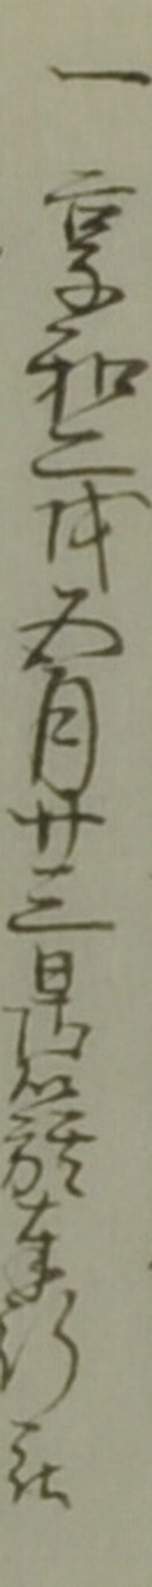一享和二戌五月廿三日御簱奉行被
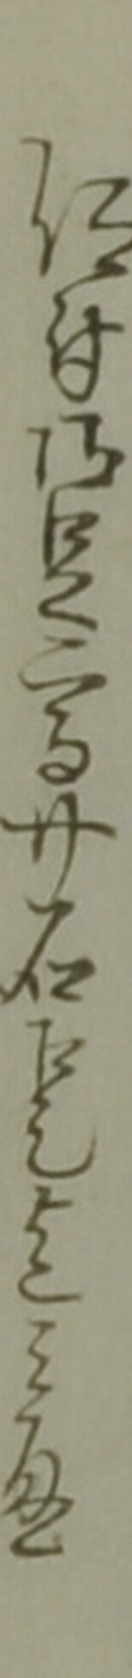仰付御足高廿石是迄之通
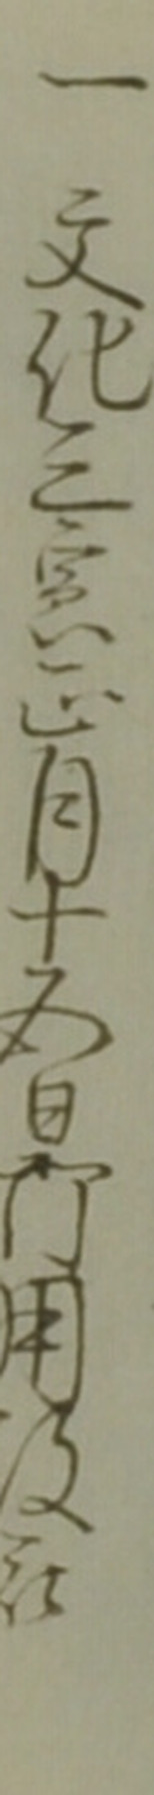一文化三寅正月十五日御用役被
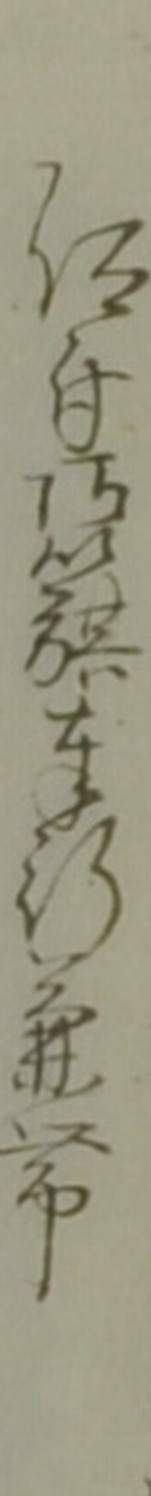仰付御籏奉行兼帯
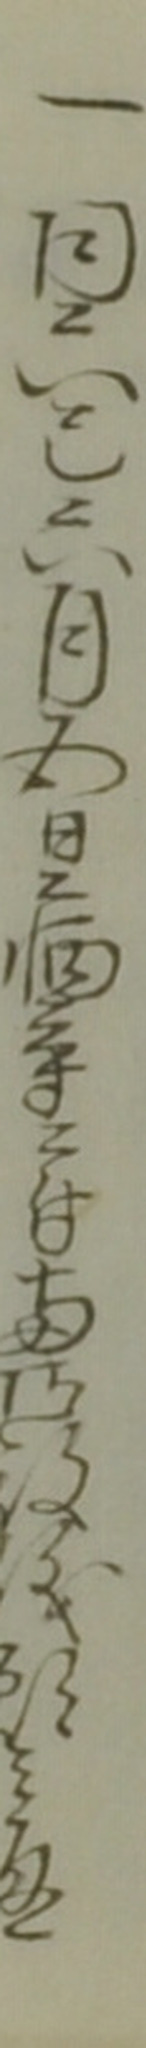一同六巳六月五日病気二付両御役儀願之通
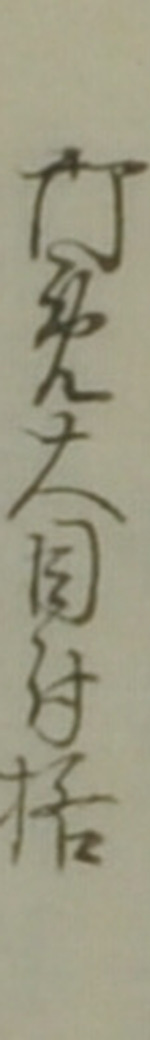御免大目付格
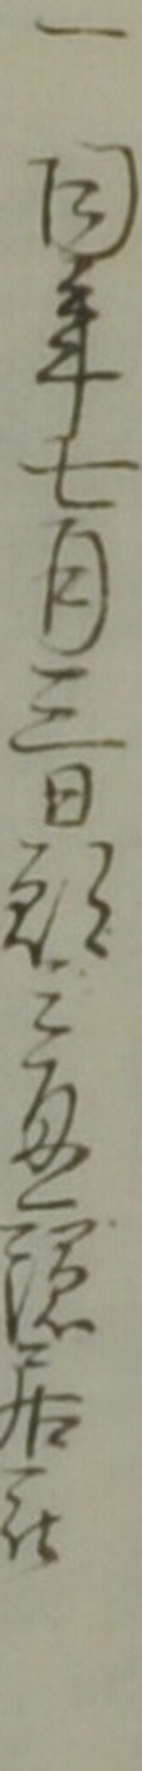一同年七月三日願之通隠居被
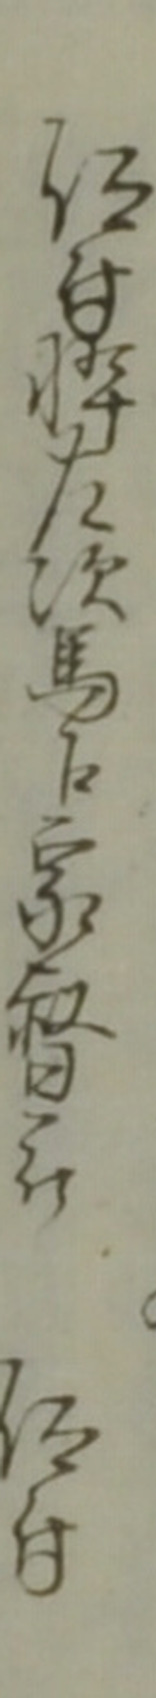仰付忰左次馬江家督被仰付
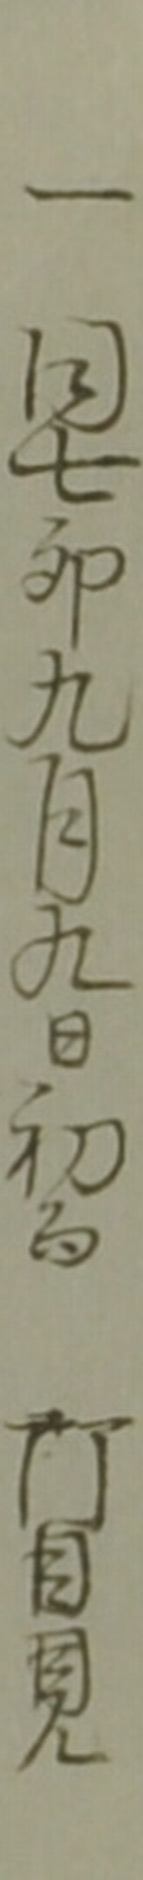一同七卯九月九日初而御目見
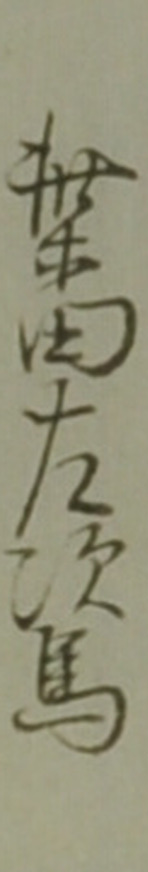柴田左次馬
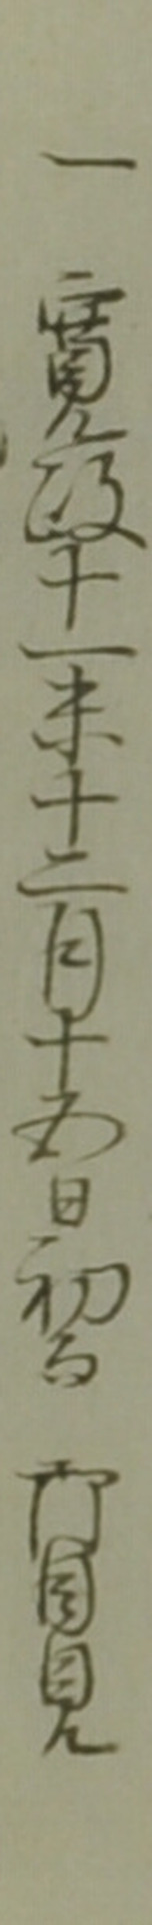一寛政十一未十二月十五日初而御目見
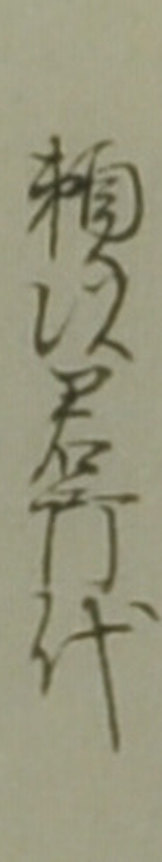頼以君御代
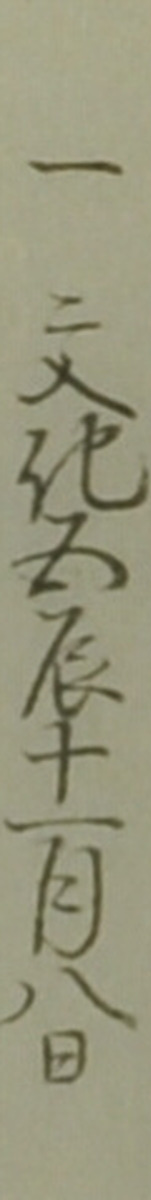一文化五辰十一月八日
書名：給人諸士勤仕録（三）
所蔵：伊那市立高遠町図書館・合同会社AMANE
